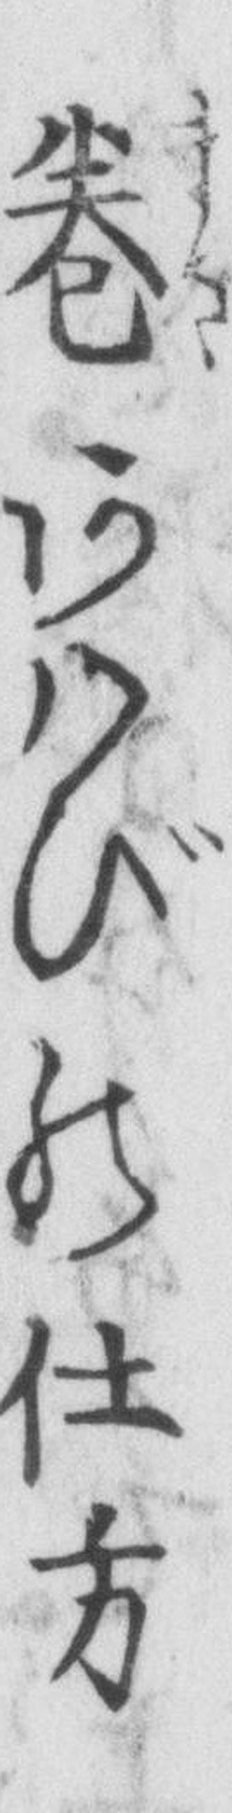巻あはびの仕方
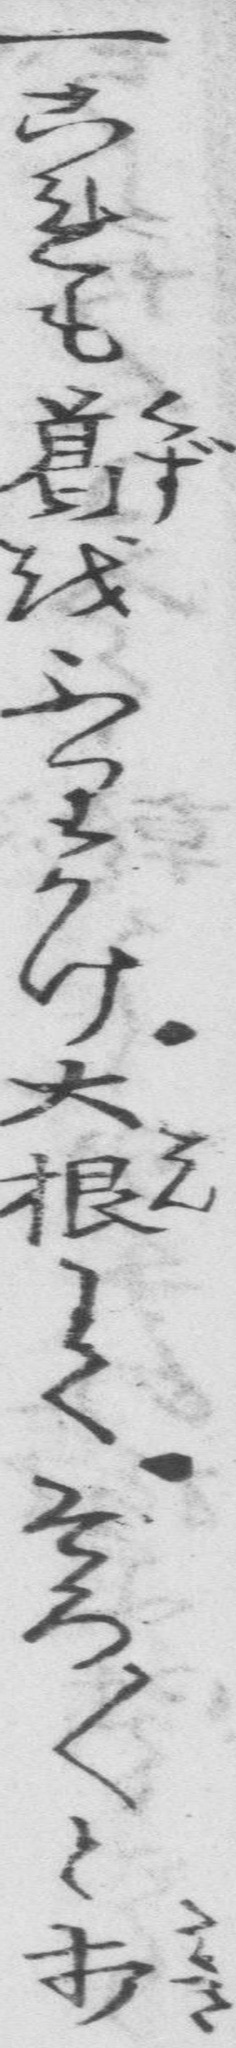一これも葛をふりかけ。大根にて。そろ〳〵と打
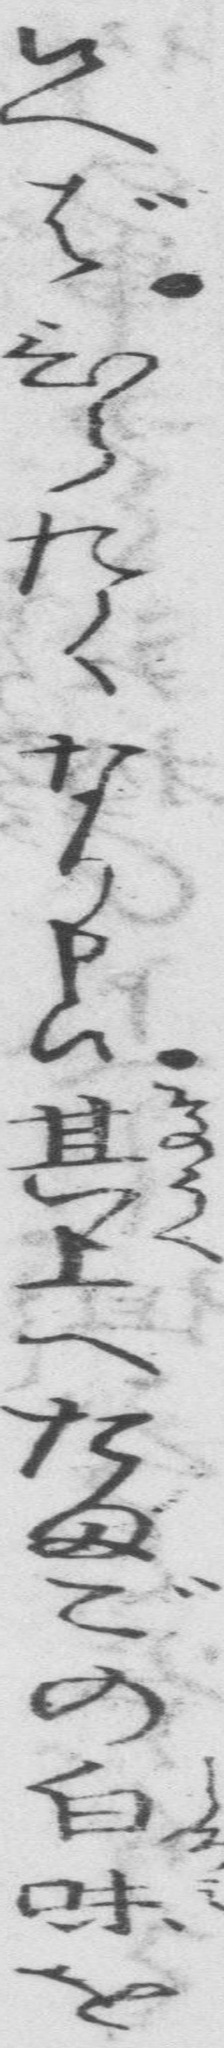候へば。ひらたくなり申候。其上へたまごの白味を
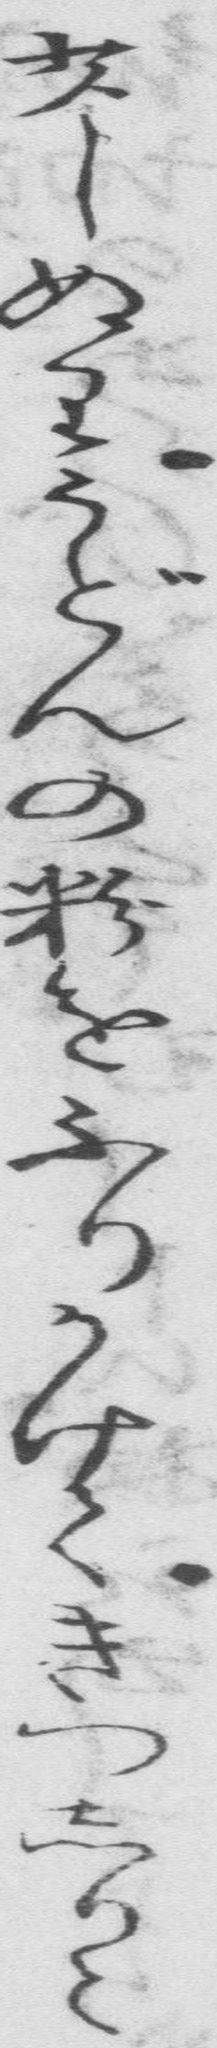少しぬり。うどんの粉をふりかけて。きつしりと
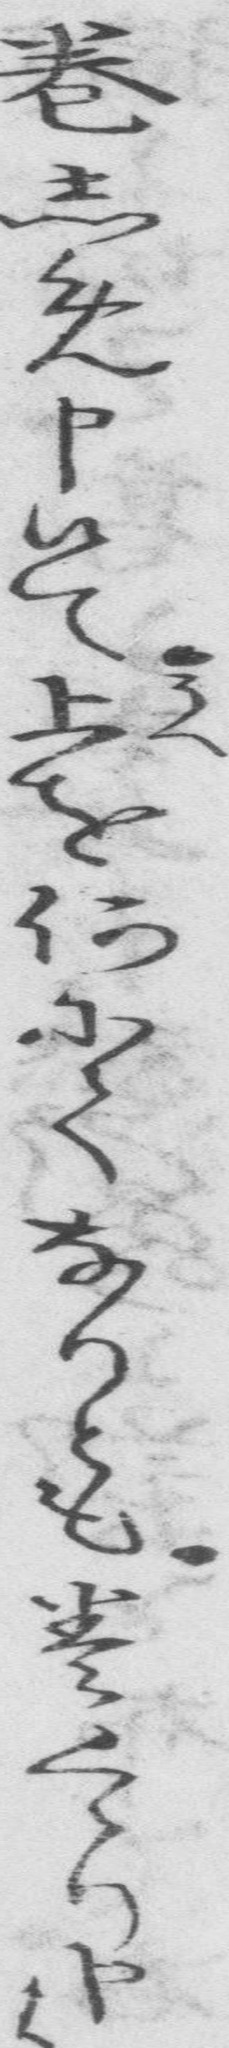巻しめ申候て。上を何にてなりとも。巻くゝり申候
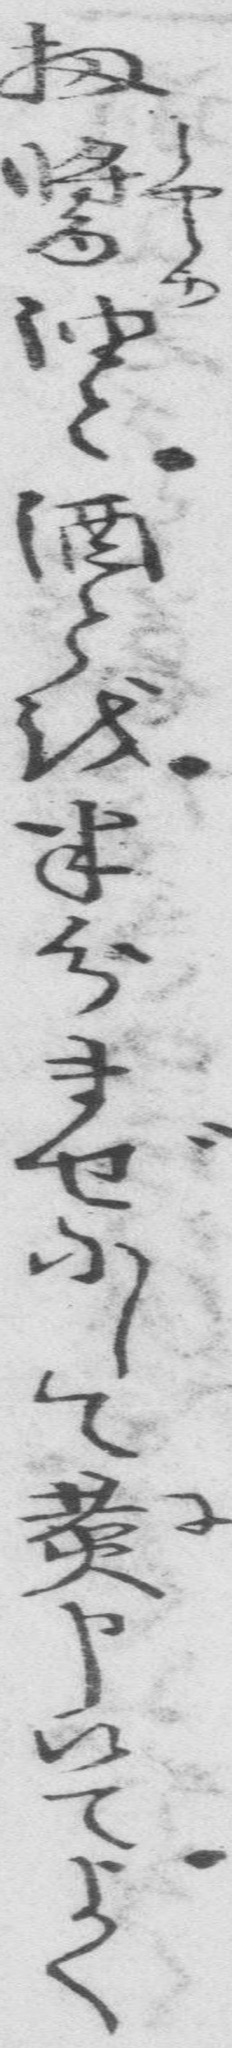扨醤油と。酒とを。半分まぜにして煮申候て。よく
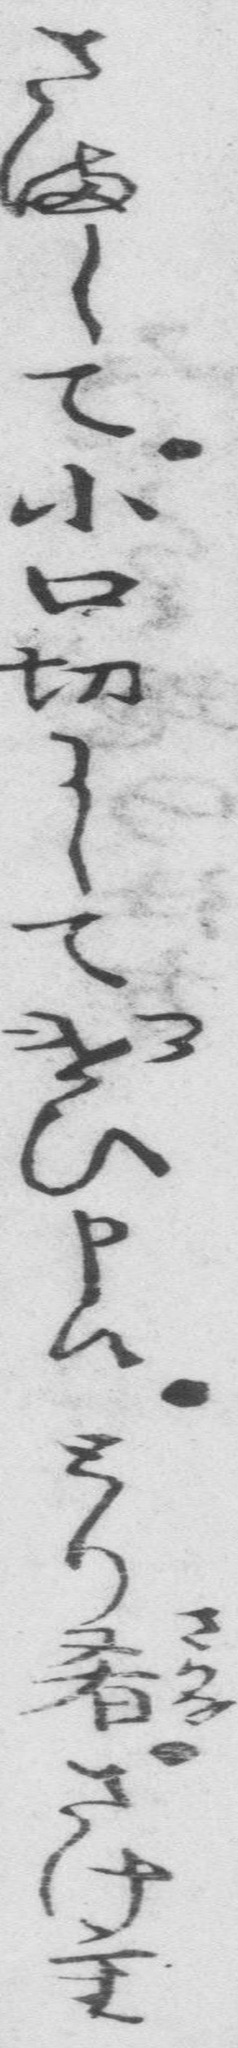さまして。小口切にして遣ひ申候。とり肴。さけ重
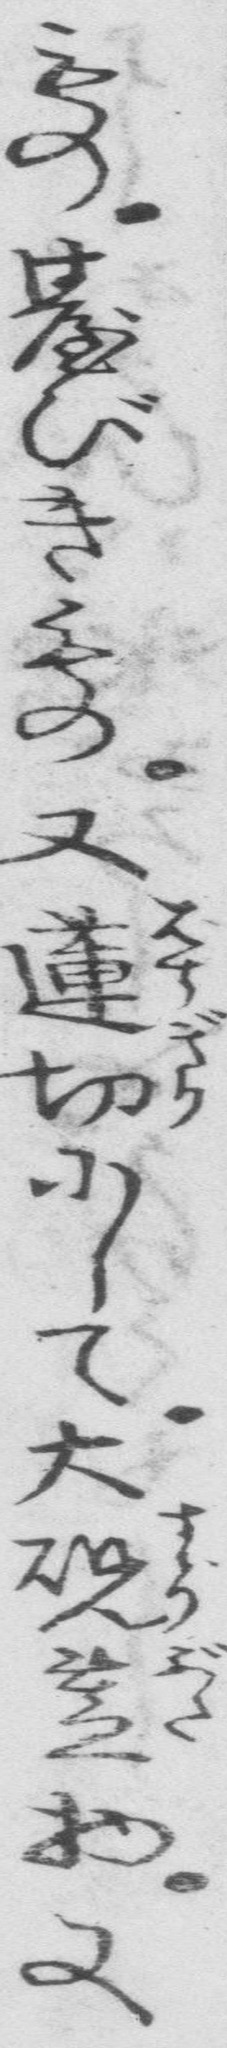もの。台びきもの。又蓮切にして。大硯蓋物。又
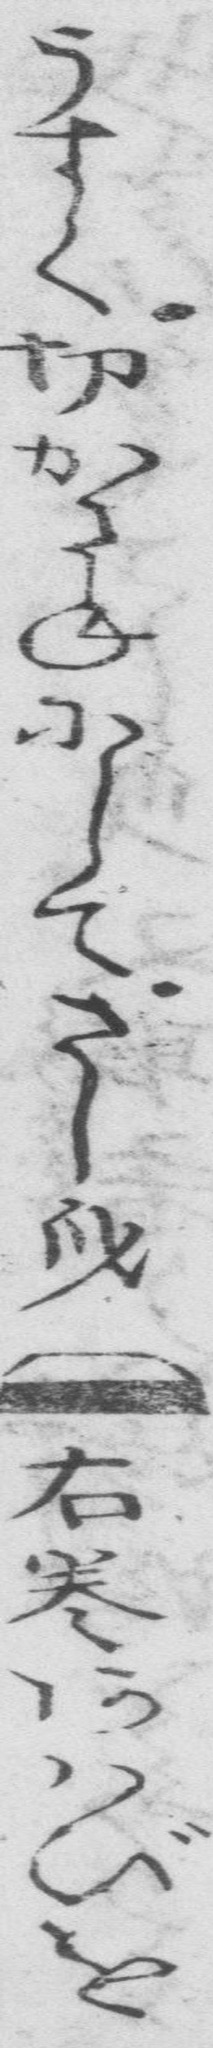うすく。切かさねにして。さし身右巻あはびを
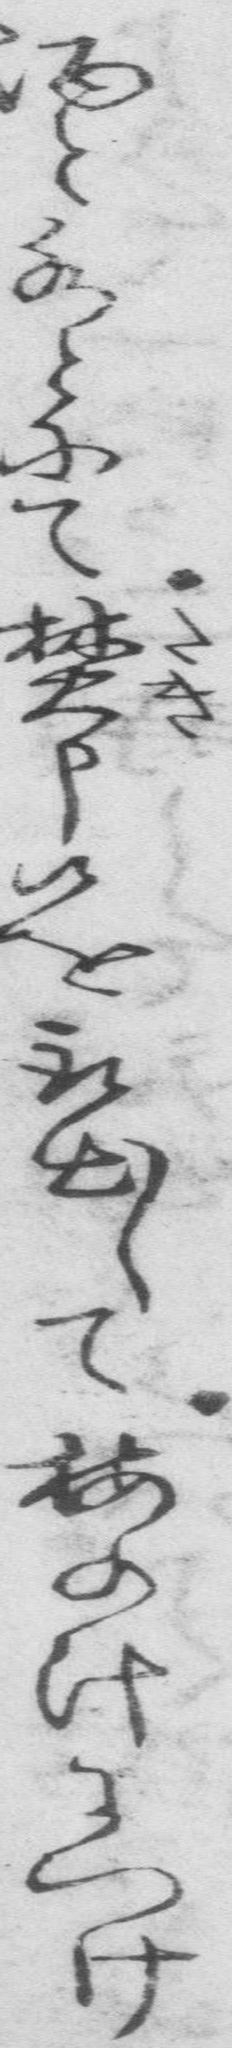酒と水とにて。焚申候を取出して。梅の汁につけ

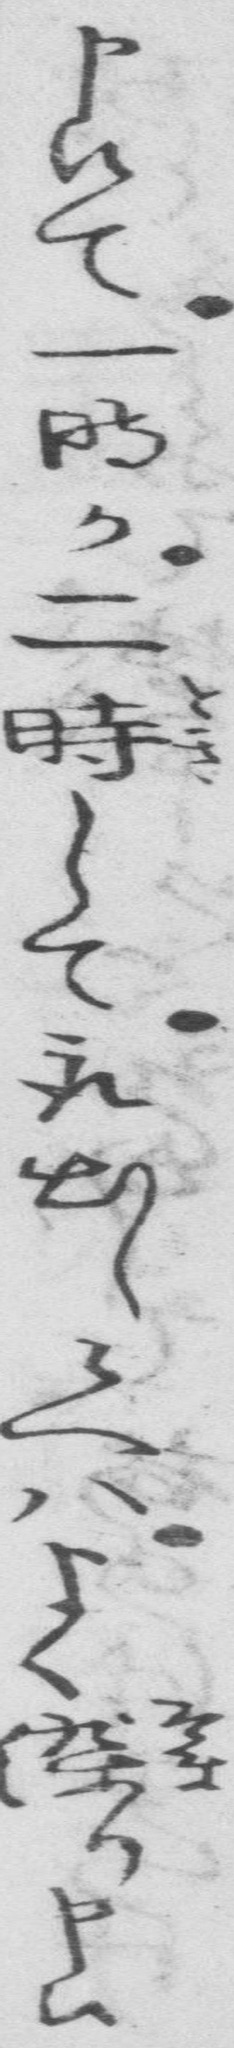申候て。一時か。二時して。取出し候へは。よく染り申候
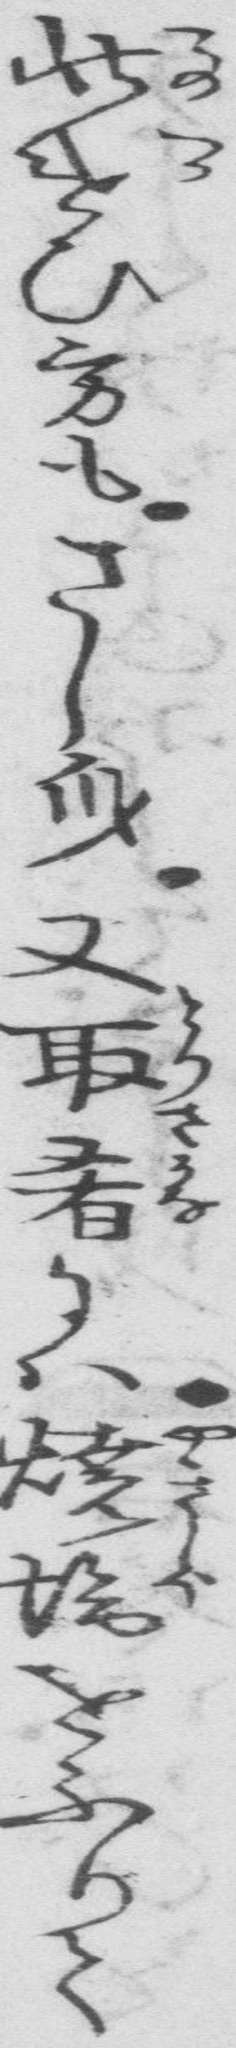此遣ひ方も。さし身。又取肴には。焼塩をふりて
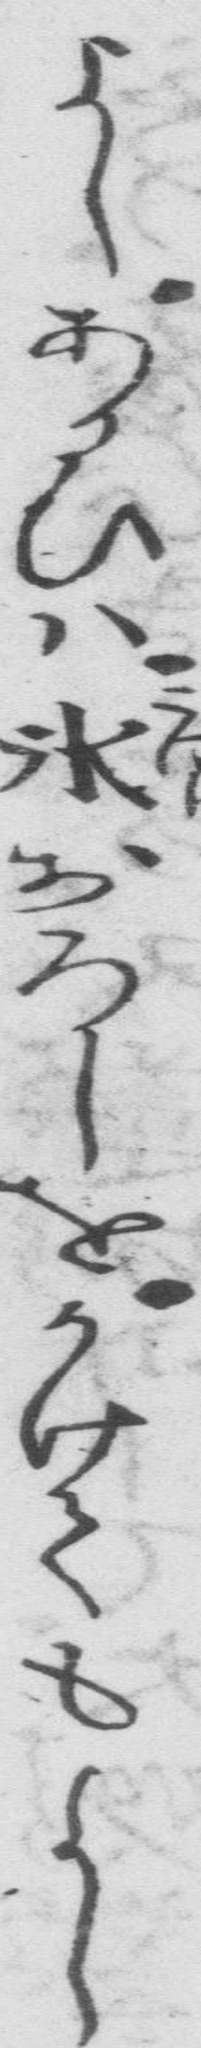よし。あるひは。氷おろしを。かけてもよし
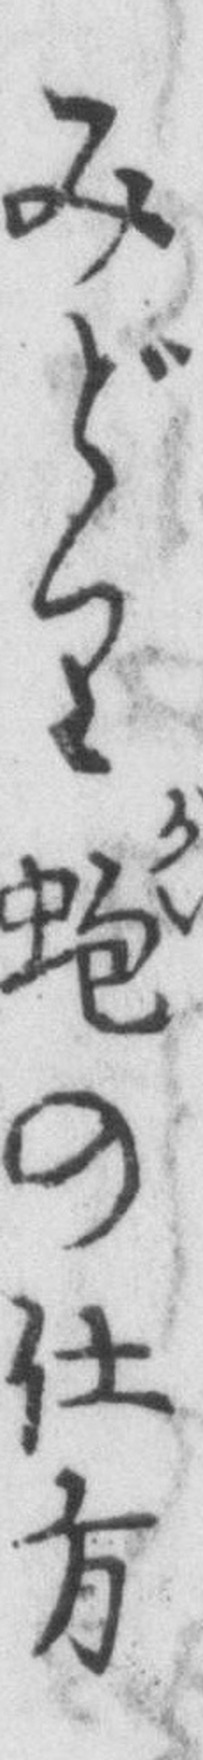みどり鮑の仕方
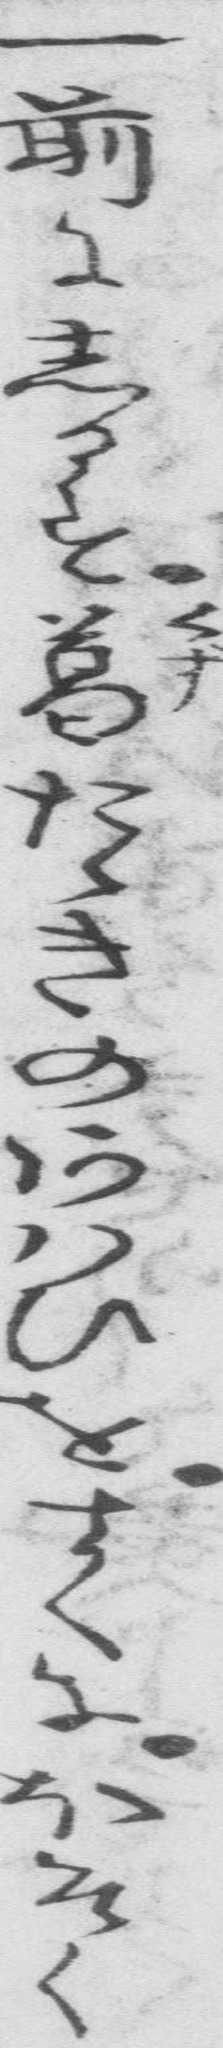一前にしるす。葛たゝきのあはひを。すくに。ほそく
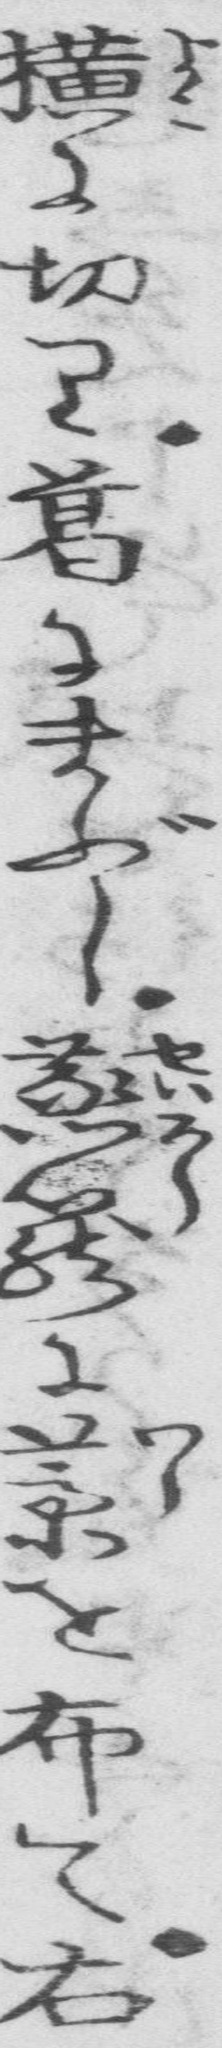横に切り。葛にまぶし。蒸籠に藁を布て。右
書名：萬寳料理秘密箱
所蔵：大阪府立大学学術情報センター 国文学研究資料館
